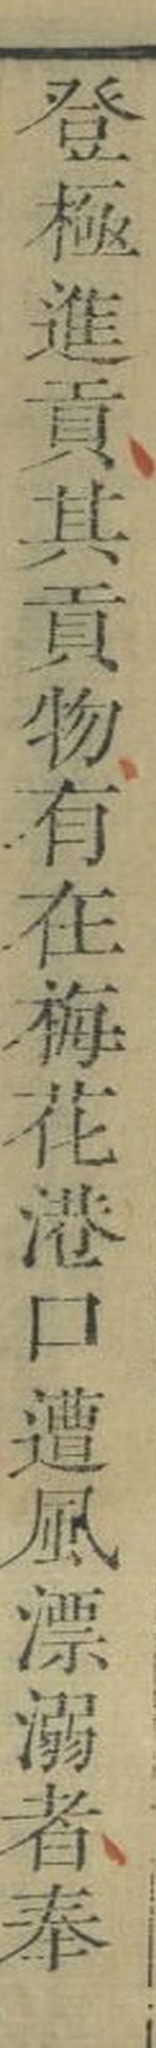登極進貢其貢物有在梅花港口遭風漂溺者奉
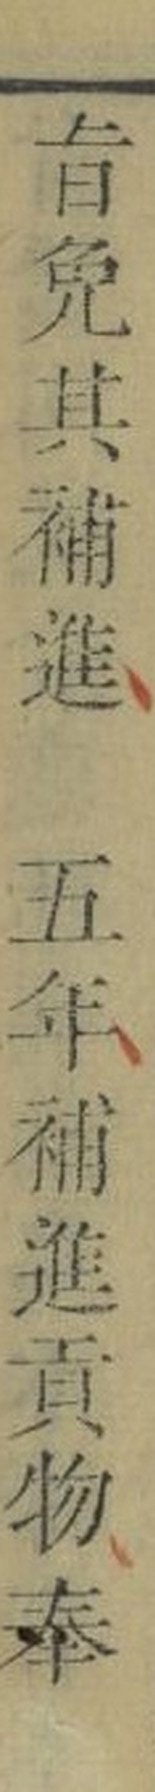旨免其補進五年補進貢物奉

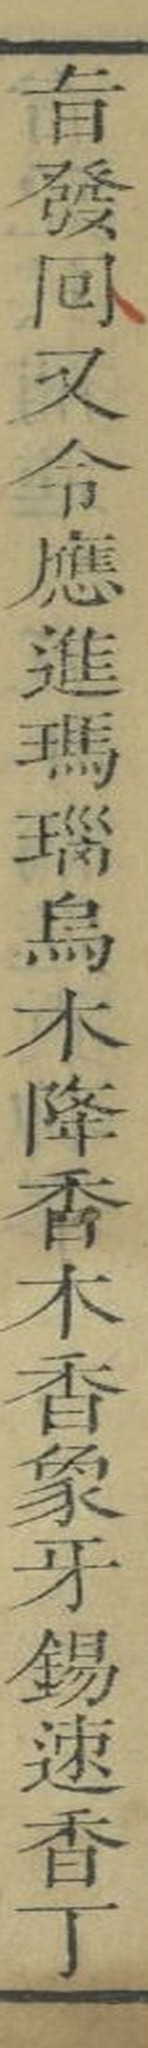旨発回又令応進瑪瑙烏木降香木香象牙錫速香丁
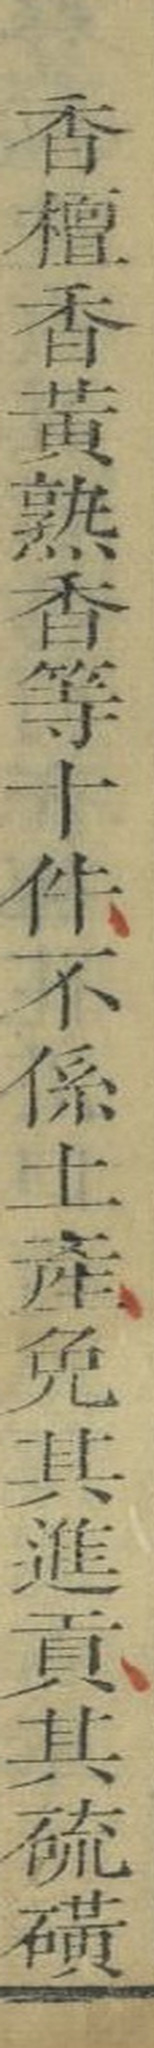香檀香黄熟香等十件不係土産免其進貢其硫磺
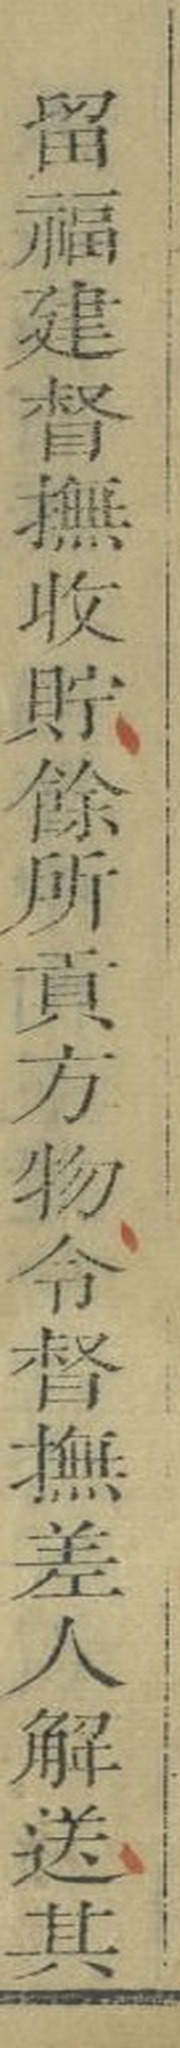留福建督撫収貯余所貢方物令督撫差人解送其
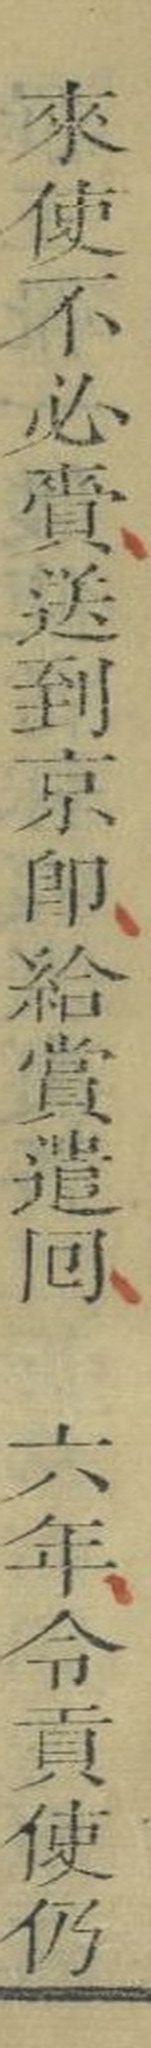来使不必賚送到京即給賞遣回六年令貢使仍
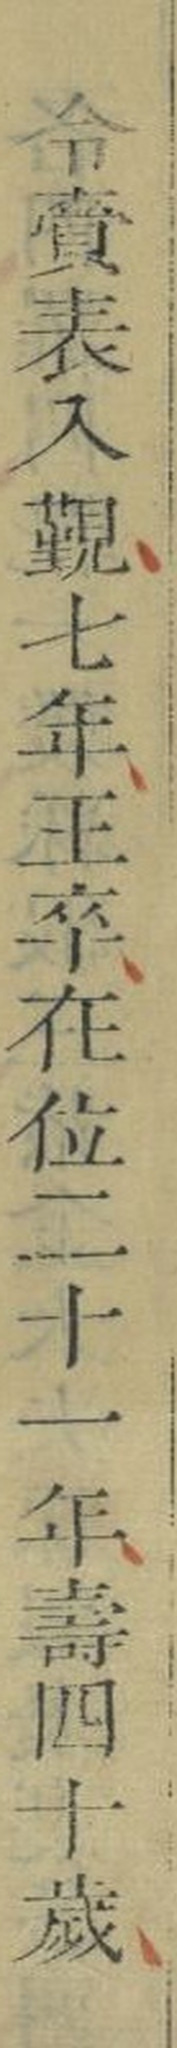令賚表入覲七年王卒在位二十一年寿四十歳
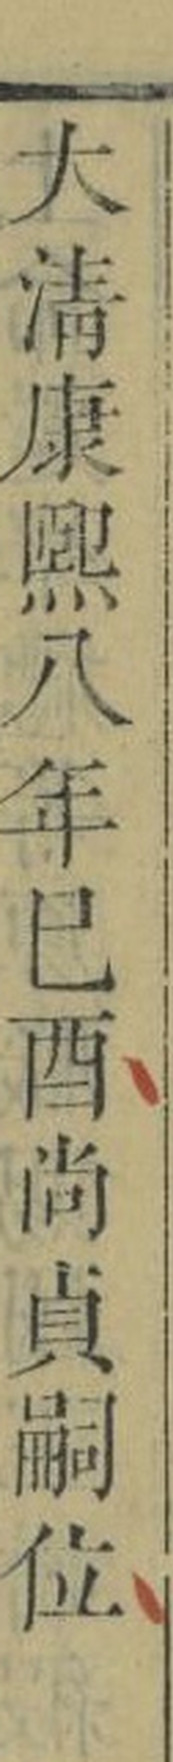大清康煕八年巳酉尚貞嗣位
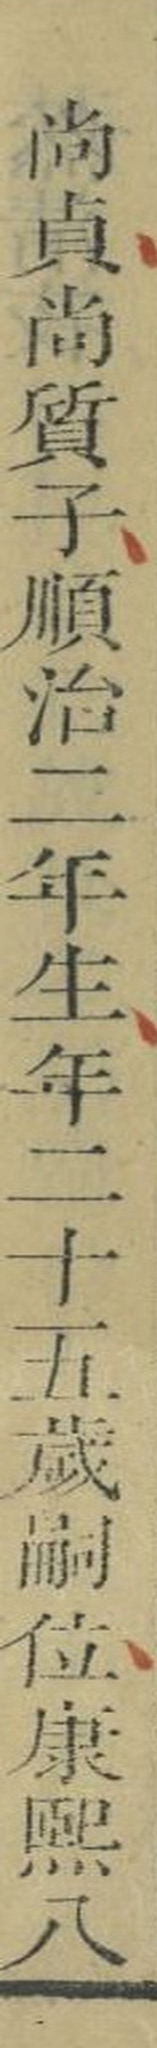尚貞尚質子順治二年生年二十五歳嗣位康煕八
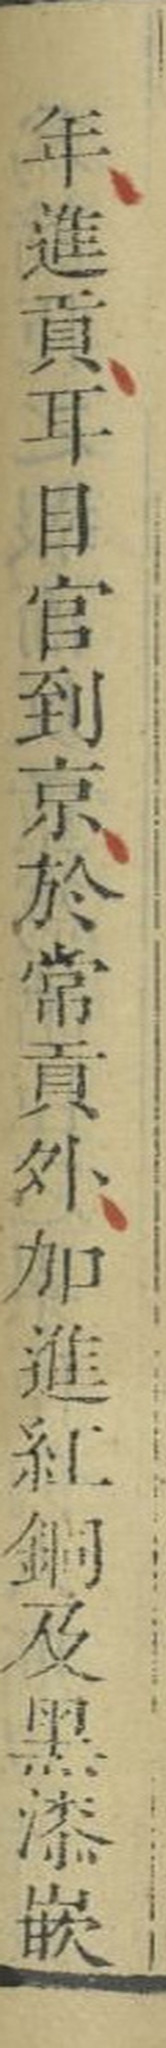年進貢耳目官到京於常貢外加進紅銅及黒漆嵌
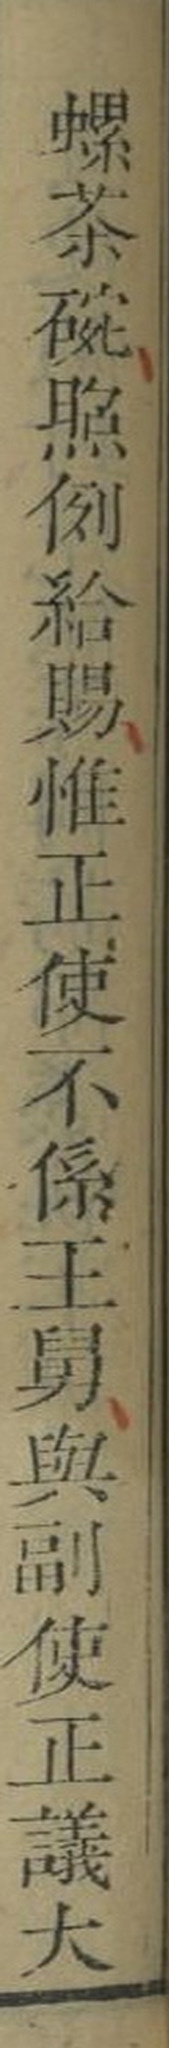螺茶碗照例給賜惟正使不係王舅与副使正議大
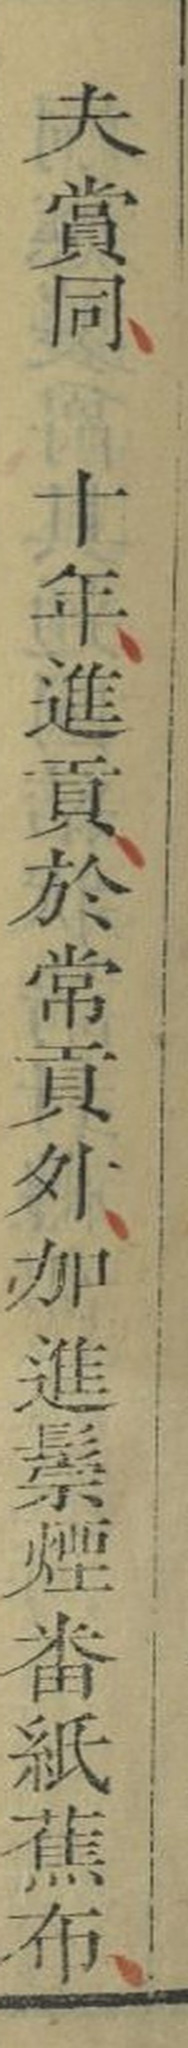夫賞同十年進貢於常貢外加進鬃煙番紙蕉布
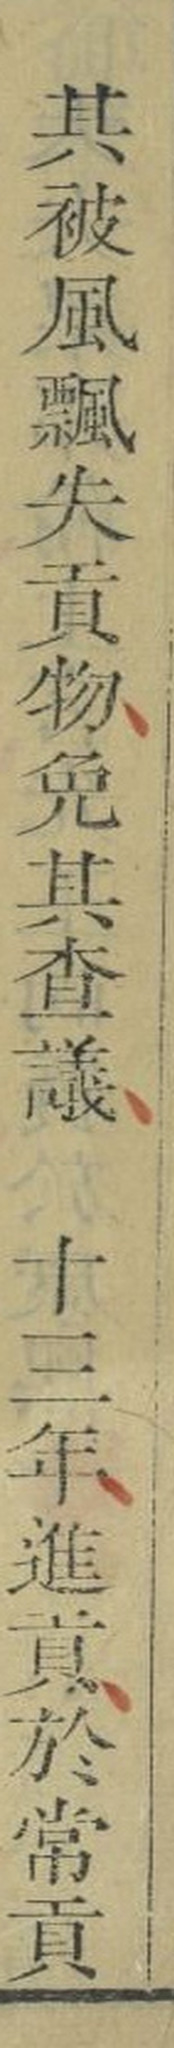其被風飄失貢物免其査議十三年進貢於常貢
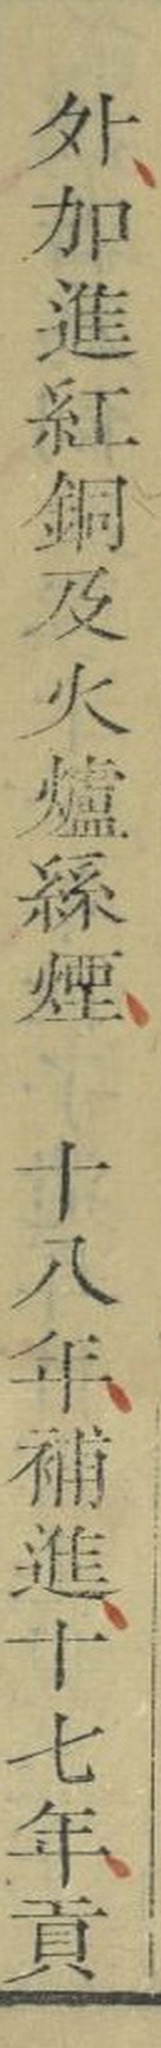外加進紅銅及火炉糸煙十八年補進十七年貢
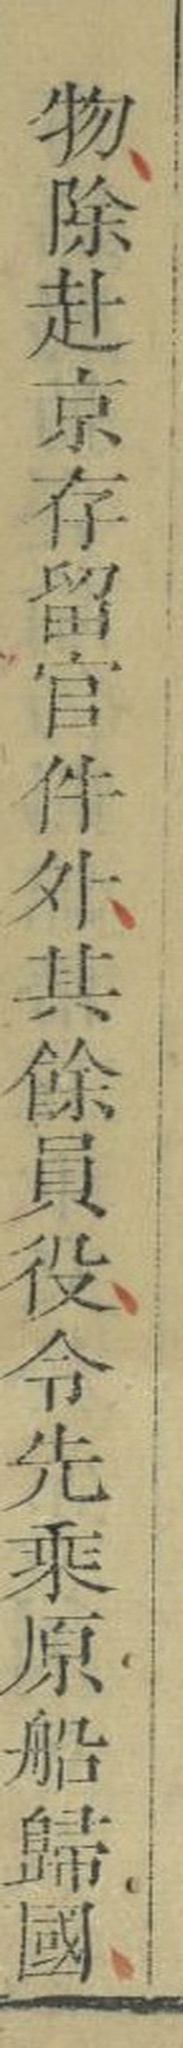物除赴京存留官件外其余員役令先乗原船帰国
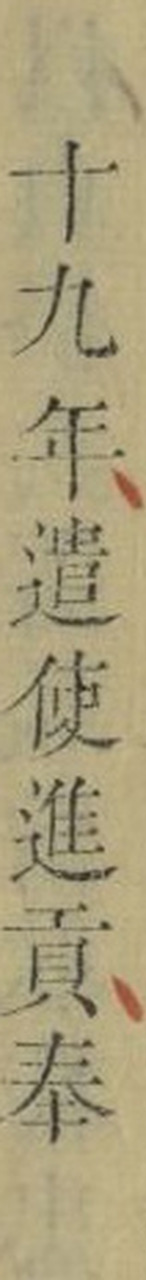十九年遣使進貢奉
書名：中山伝信録 巻三
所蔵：University of the Ryukyus Library
